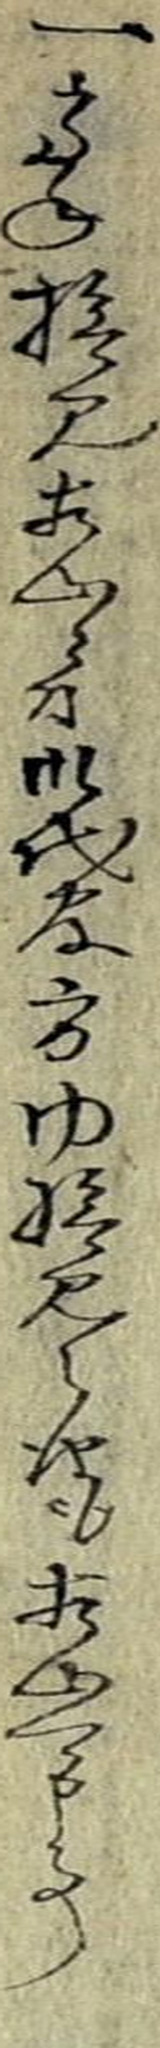一当年検見相止ニ付御代官方内検見之儀も相止可申事
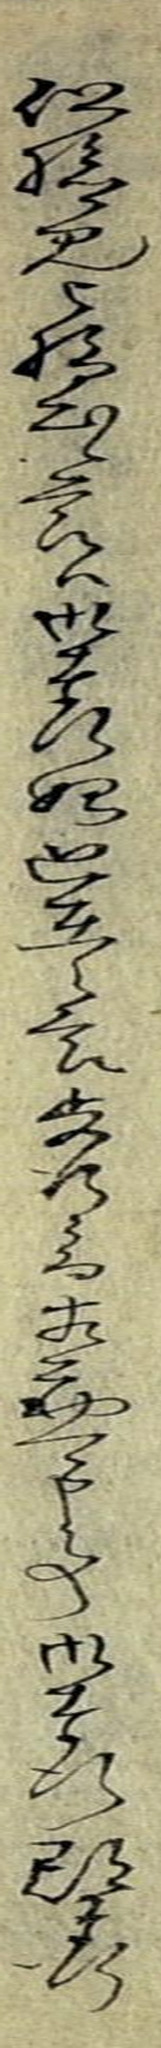但検見被指出候節ハ御奉行始廻在之節歩行ニ而相勤可申事御奉行郡奉行
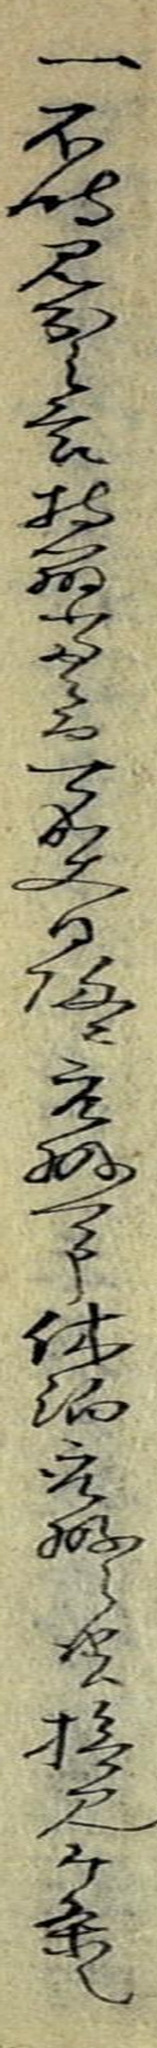一不時見分之節持弁当ニ而可成丈日帰ニ取扱可申休泊取扱之儀ハ検見ケ条之
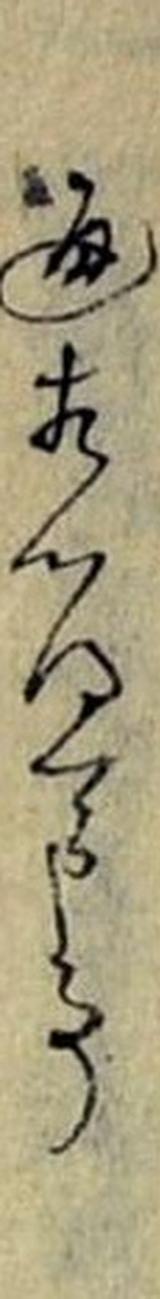通相心得可申事
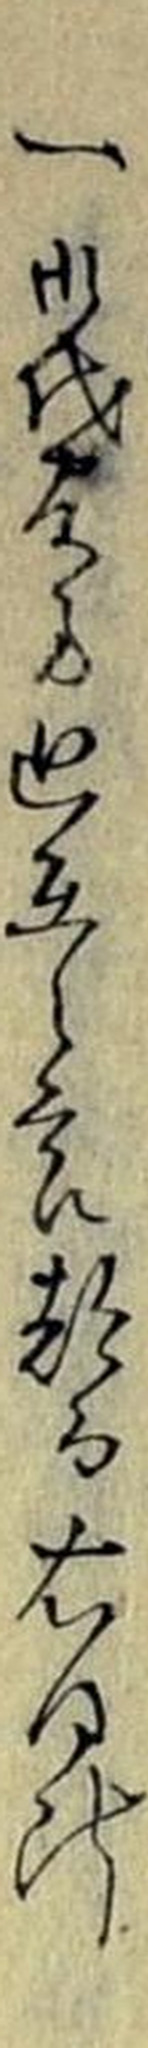一御代官方廻在之節都而右同断
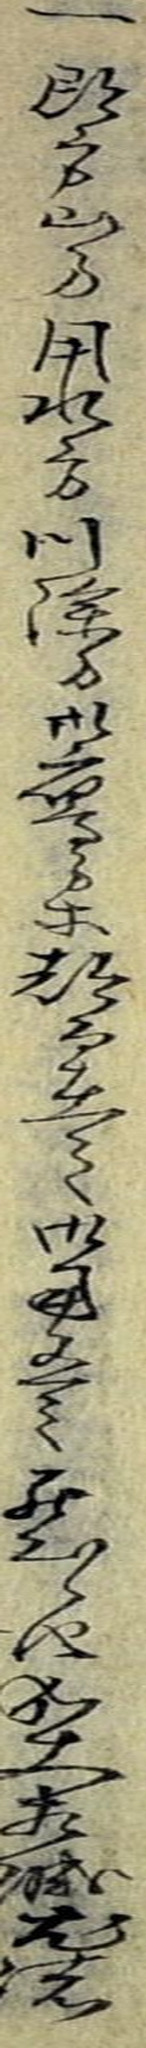一郡方山方用水方川除方御鷹方等都而在々へ御用有之罷出候儀成丈相減尤諸
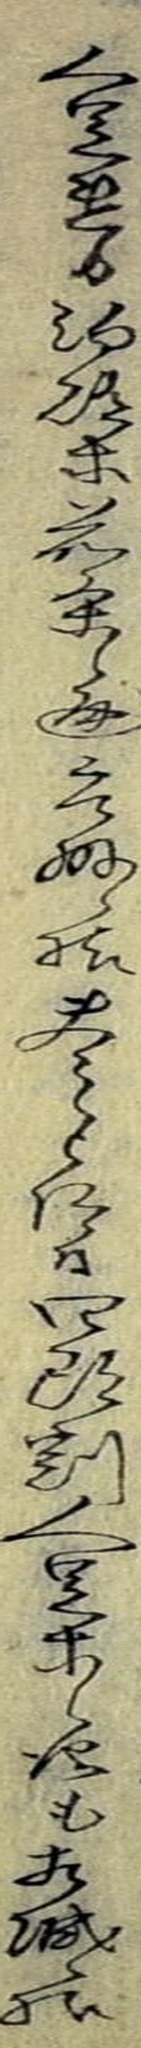人足遣方泊賄等前条之通取扱候様夫々へ被仰付四郡割人足等之儀も相減候様
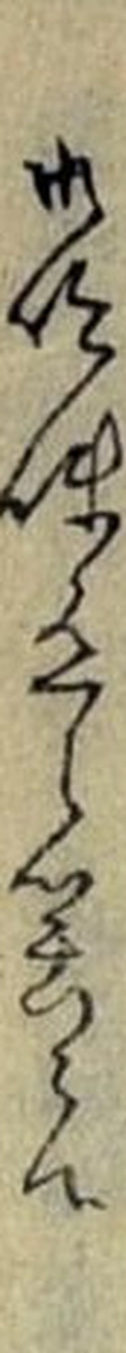御吟味有之筈ニ候
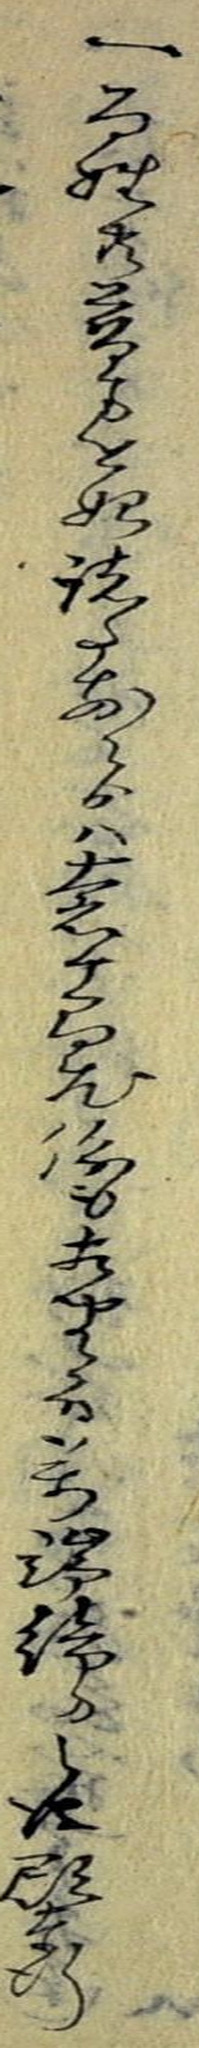一百姓共暮方を始諸事前々ゟハ奢ケ間敷儀も相聞候ニ付万端締方之儀郡奉行
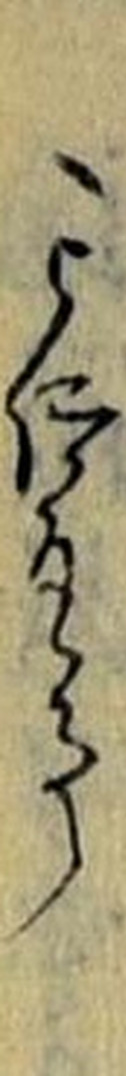へ仰付候事
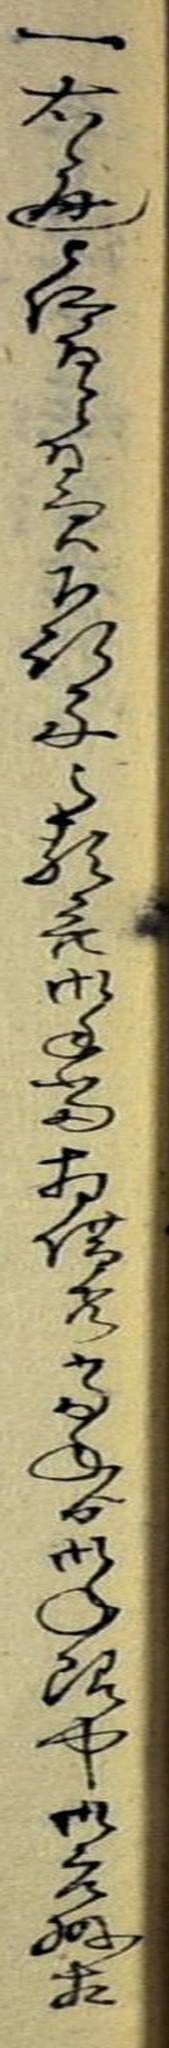一右之通被仰付候ニ付而ハ下行米之類并御手当拝借共当年ゟ御年限中
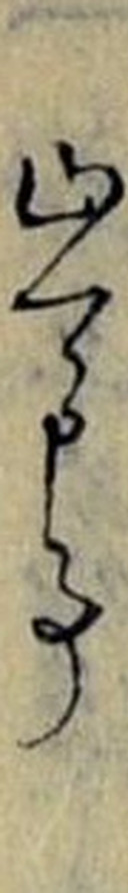止可申事
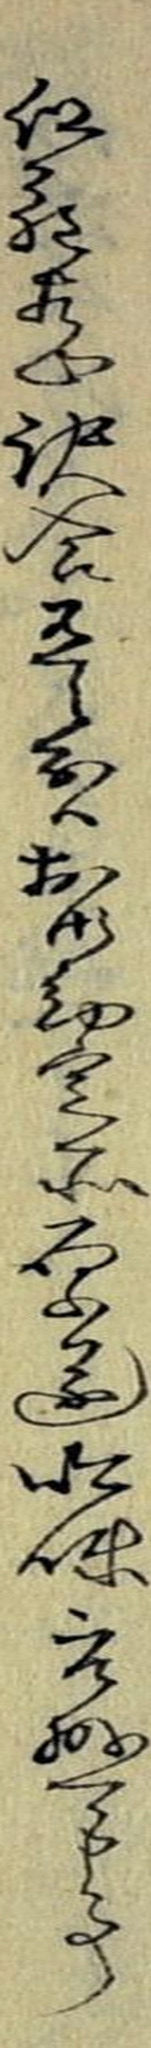但難相止訳合有之分於御勘定所厚遂吟味取扱可申事
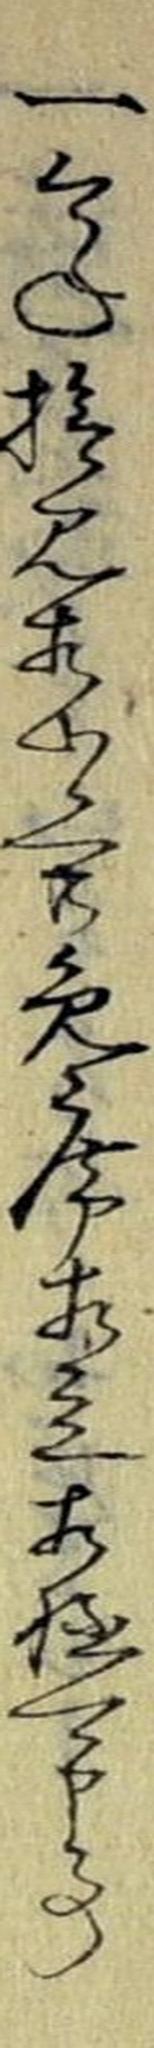一今年検見相止候へ共免席相立相極可申事
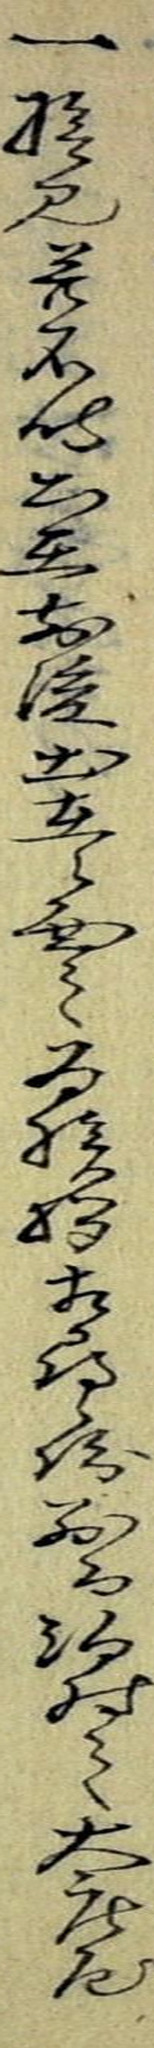一検見并不時出在前後出在之面々為挨拶相尋候儀別而泊村之大庄屋
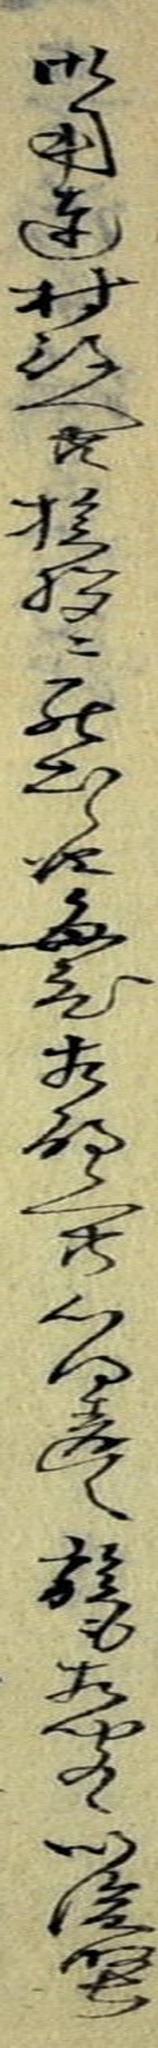御用達村役人共挨拶ニ罷出候儀毎度相触候へ共心得違之族も相聞候以後堅
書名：命令之部 五
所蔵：福井県文書館 Fukui Prefectural Archives
